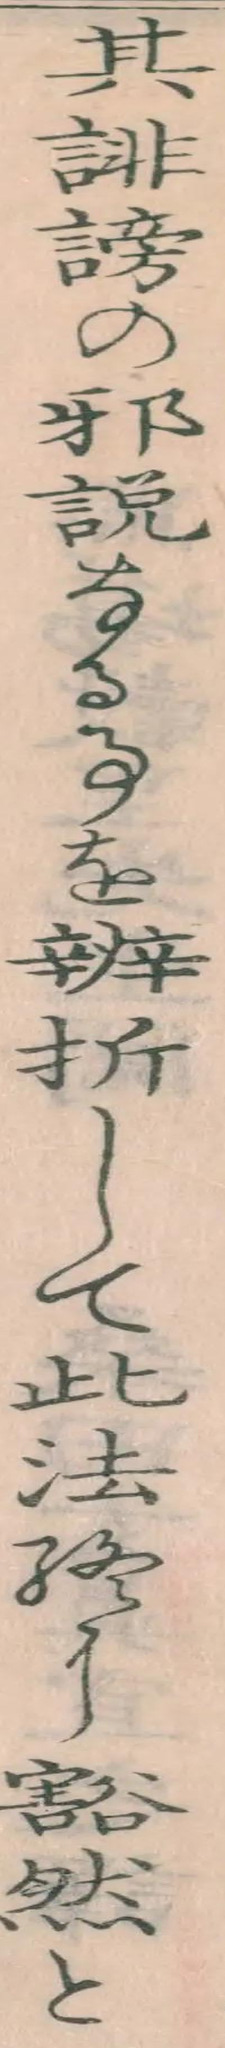其誹謗の邪説なる事を辨折して此法終に豁然と
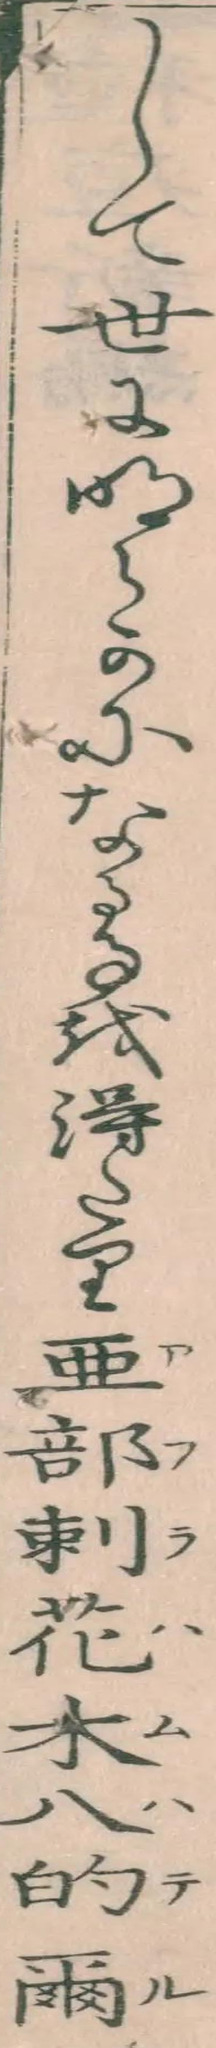して世に明らかになるを得たり亜部刺花木八的爾
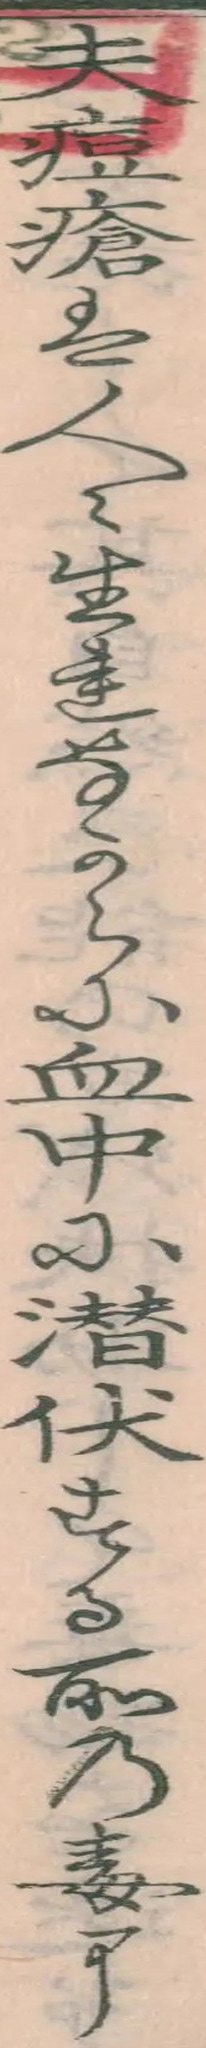夫痘瘡は人々生れなからに血中に潜伏する所の毒中
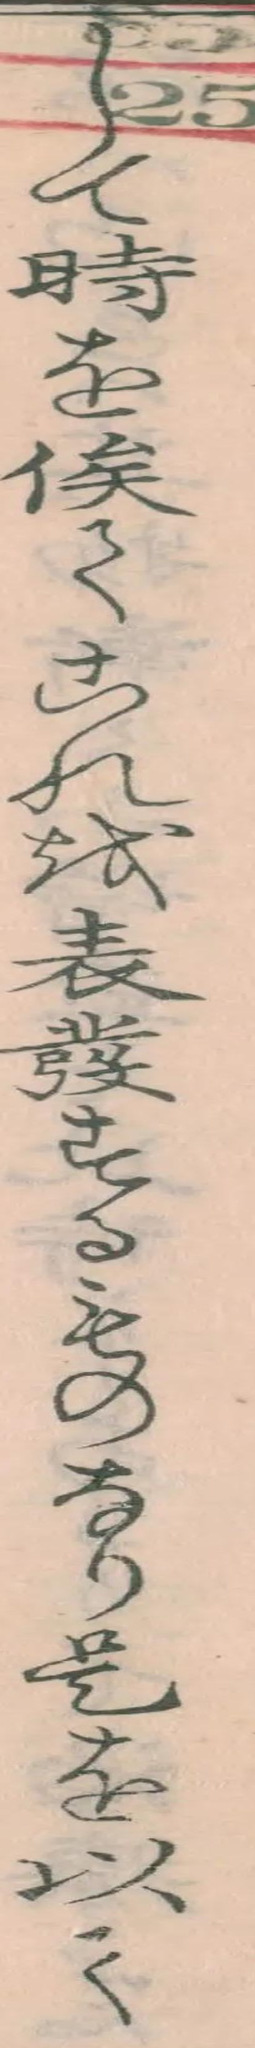して時を俟てこれを表發するものなり是を以て
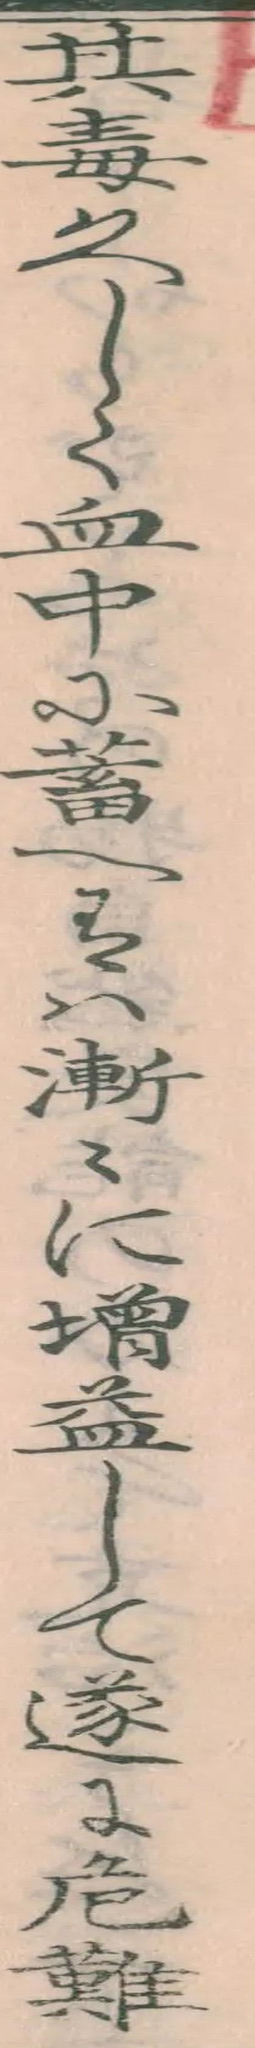其毒久しく血中に蓄へはは漸々に増益して遂に危難
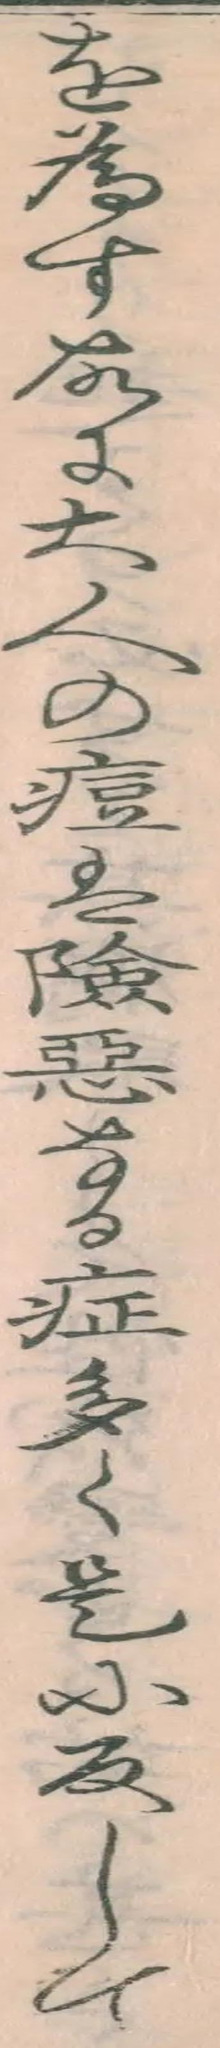を為す故に大人の痘は険惡なる症多く是に反して
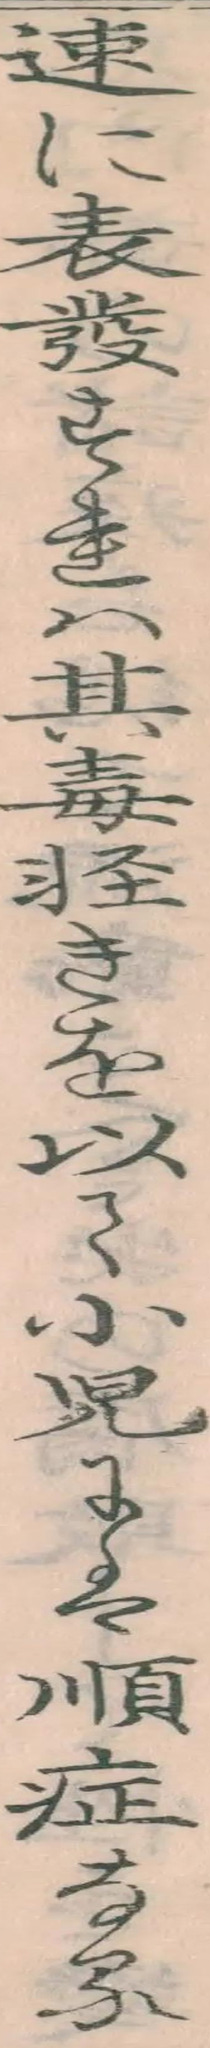速に表發すれは其毒怪きを以て小児には順症なる
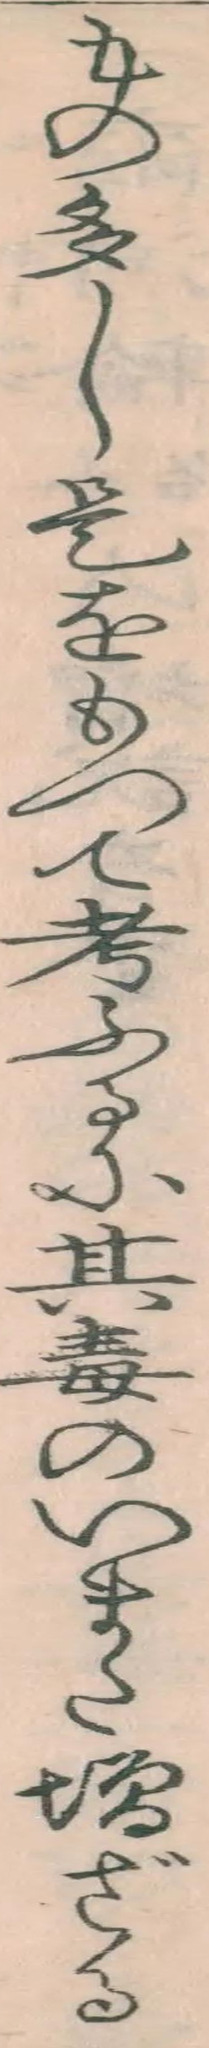もの多し是をもつて考ふるに其毒のいまた増ざる
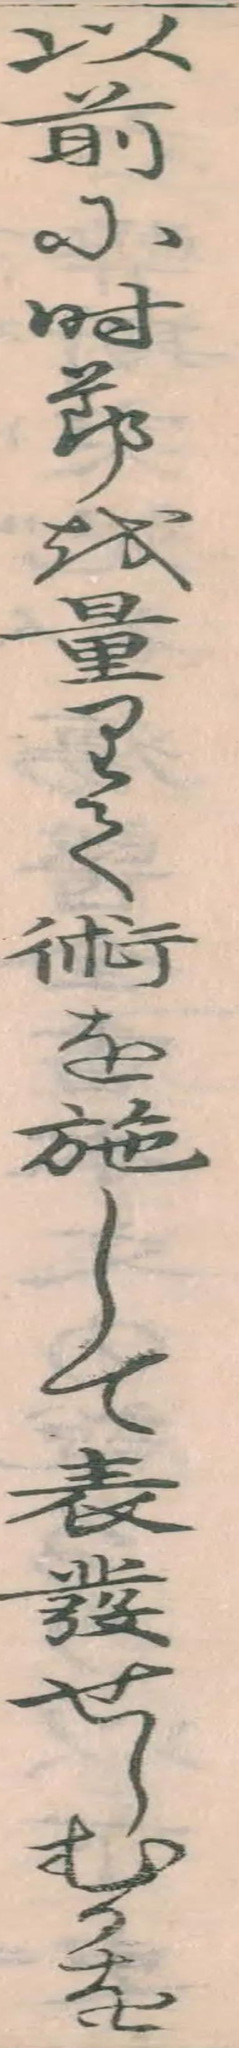以前に時節を量りて術を施して表發せしむかを
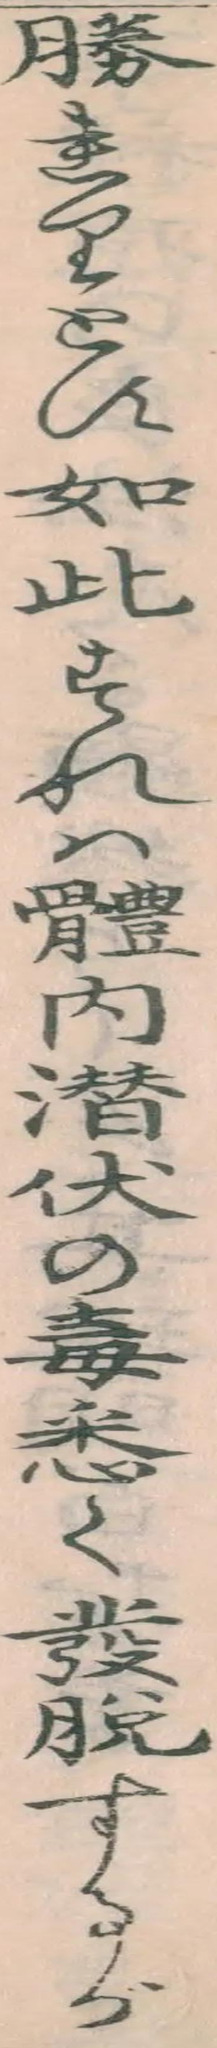勝れりとす如此すれは體内潜伏の毒悉く發脱するか
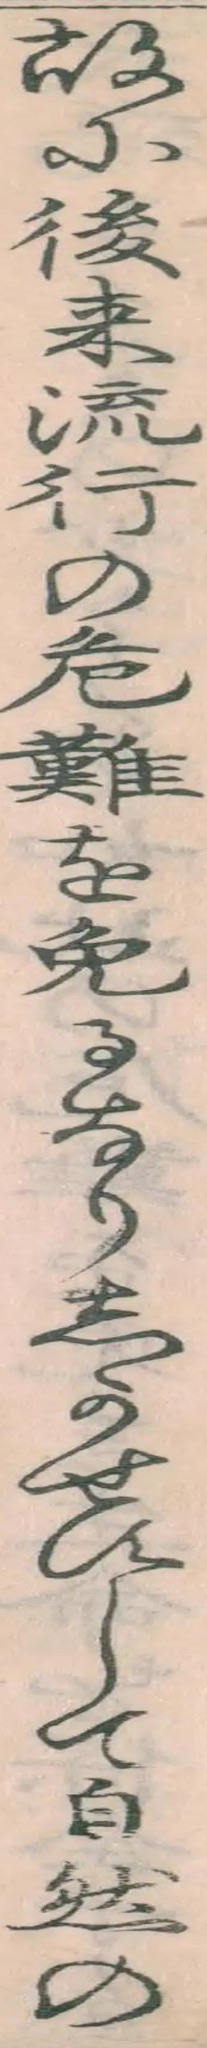故に後来流行の危難を免るなりしかせすして自然の
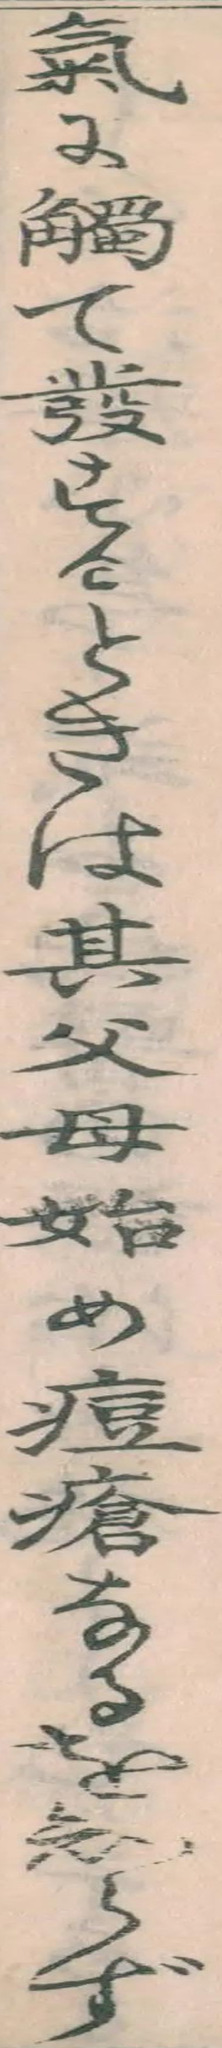氣に觸て發するときは其父母始め痘瘡なるを知らず

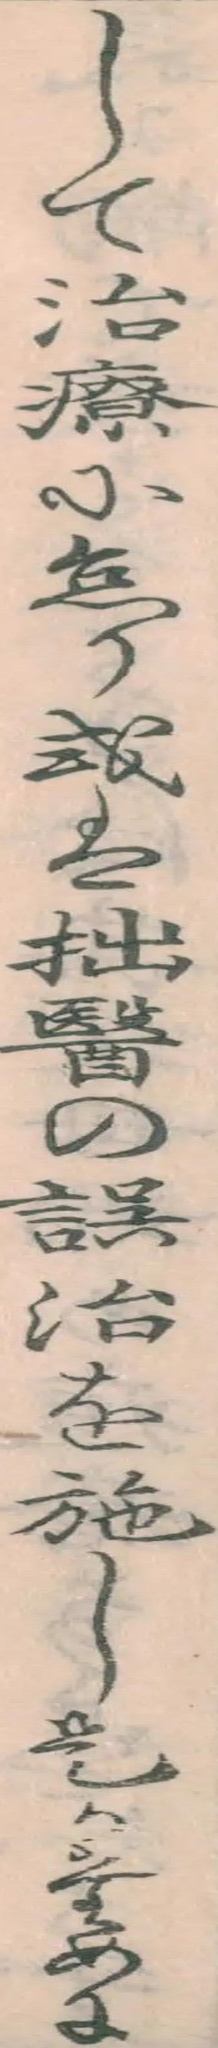して治療に怠り或は拙醫の誤治を施し是からために
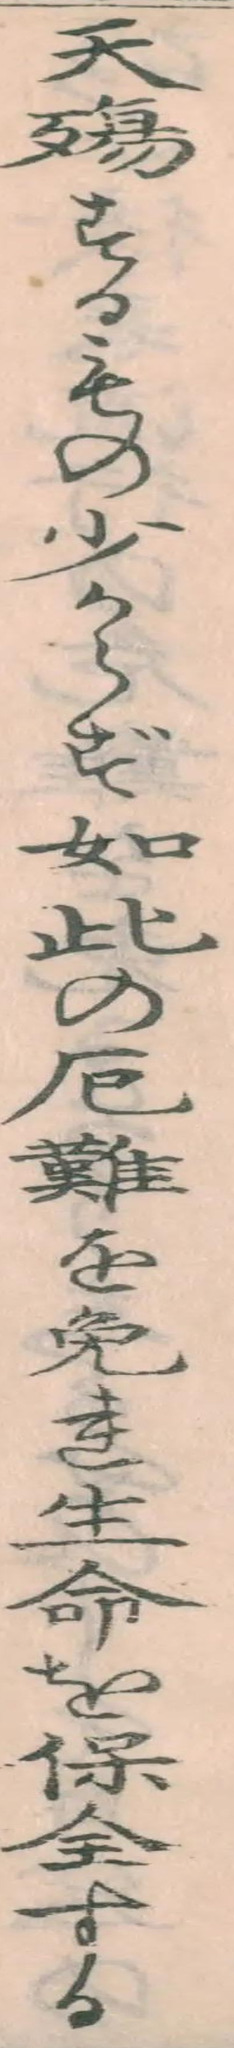天殤するもの少からず如此の厄難を免れ生命を保全する
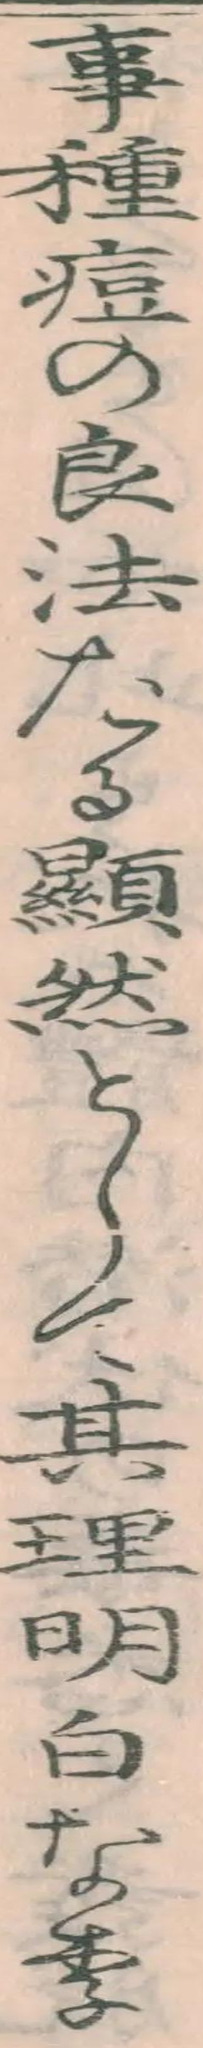事種痘の良法たる顯然として其理明白な季
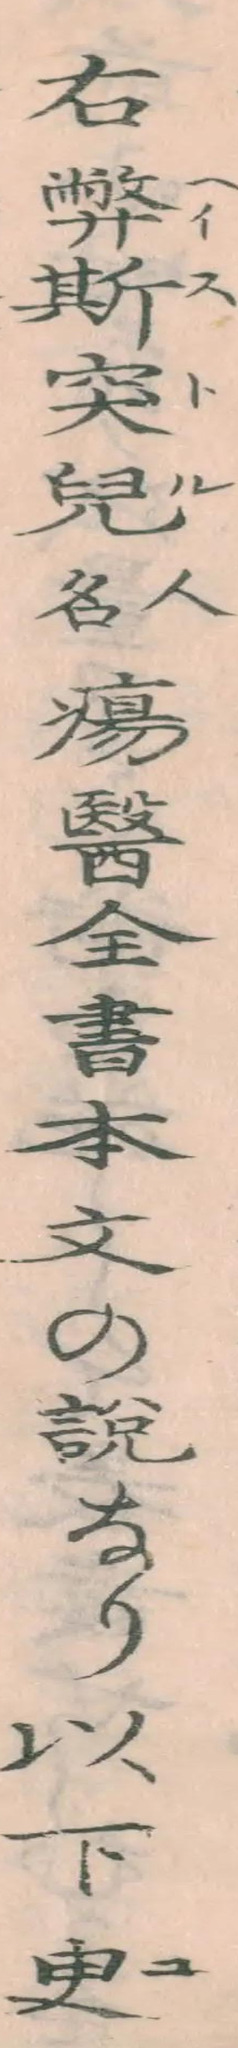右幣斯突兒人名傷醫全書本文の説なり以下曳
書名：種痘新編
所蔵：国立国会図書館 National Diet Library, JAPAN
